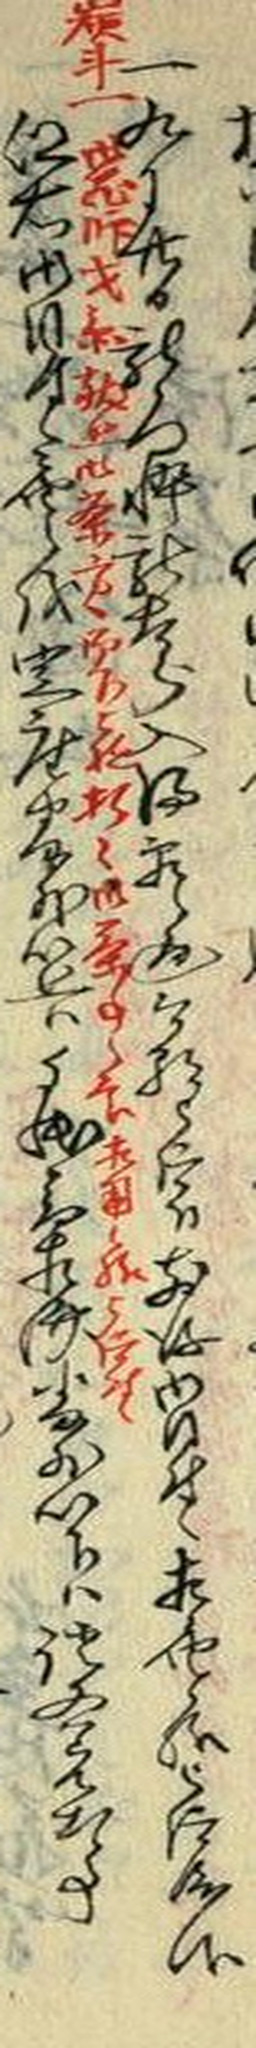但右御目付へ届之儀定座番外以上ハ手紙ニ而相済番外以下ハ証文差出候事
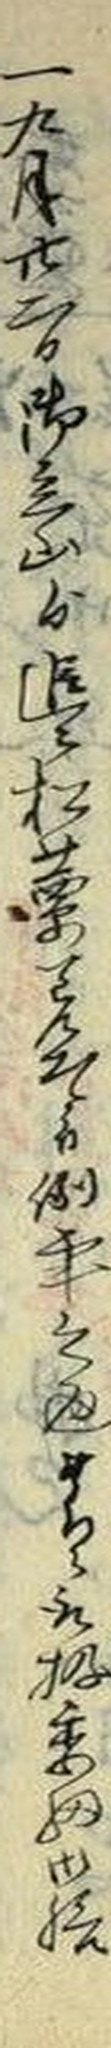一九月廿二日御立山ゟ追々松蕈差出候ニ付例年之通被下ニ取扱委細御膳
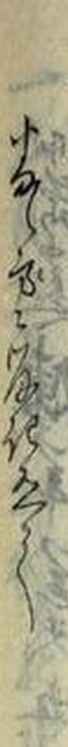番之方ニ留記有之
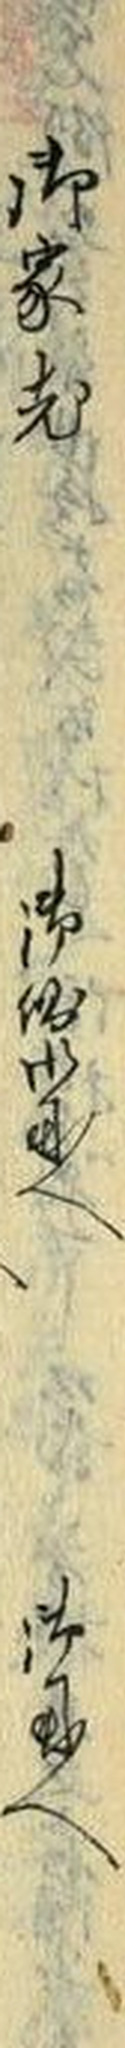御家老御側御用人御用人
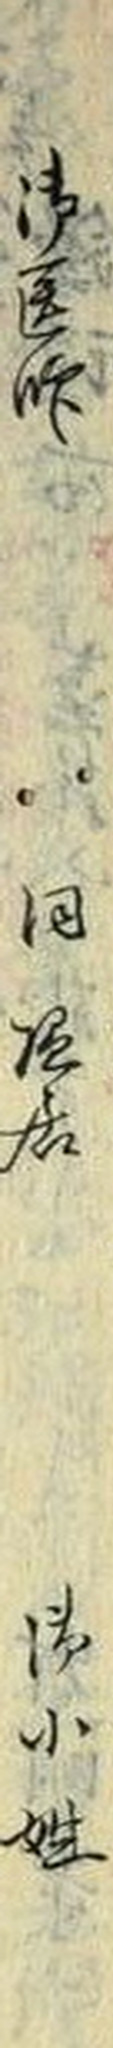御医師同隠居御小姓
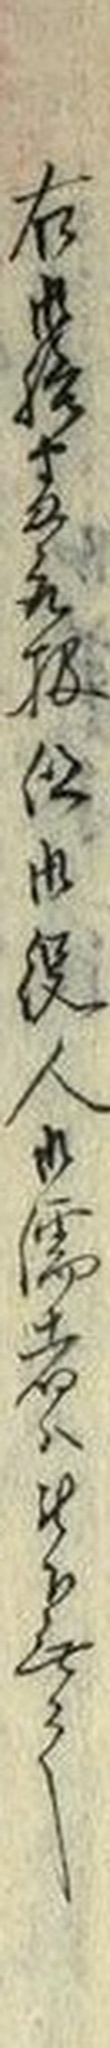右御膳番取扱但御役人御儒者ハ被下無之
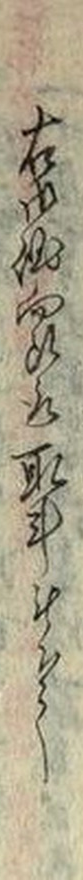右御側向頭取取計被下之
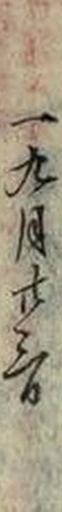一九月廿三日
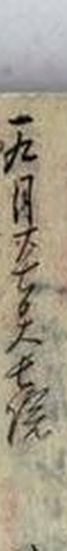一九月廿七日大長院
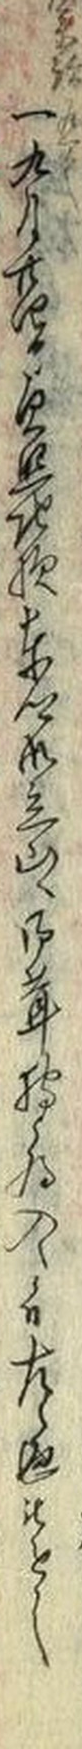一九月廿四日貞照院様東郷御立山へ御茸狩被為入候ニ付左之通被進之
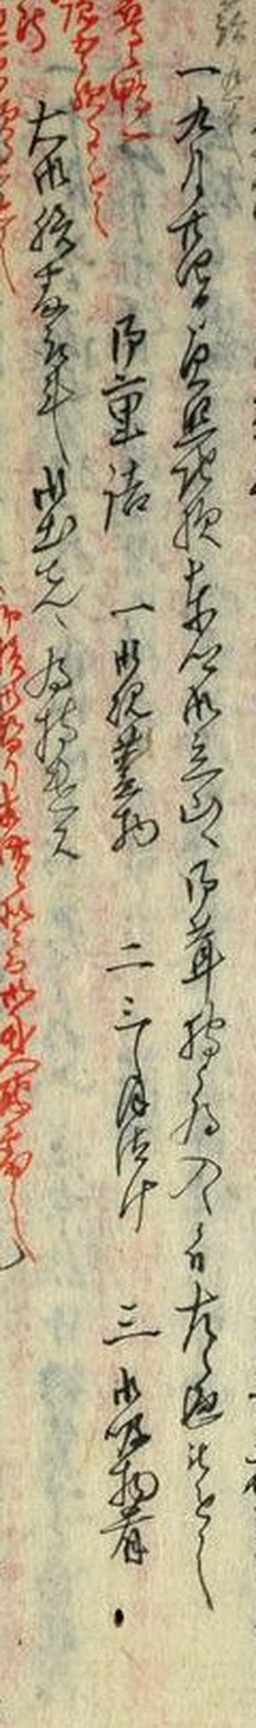御重詰一御硯蓋物二みしつつけ三御吸物肴
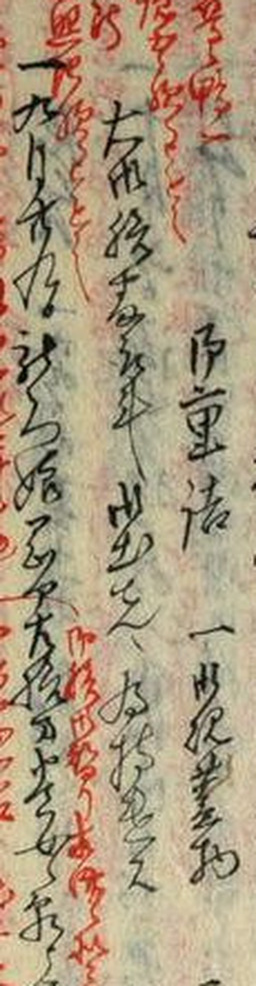右御膳番取計御出先へ為持遣ス
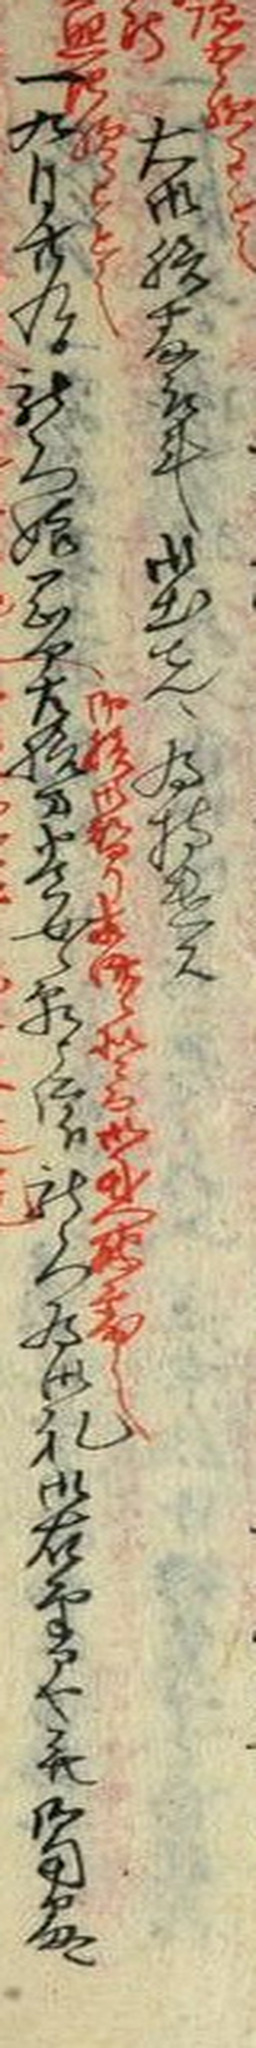一九月廿九日新右衛門娘岡部左膳方養女へ願被仰付新右衛門為御礼御右筆部や幷御用番へ

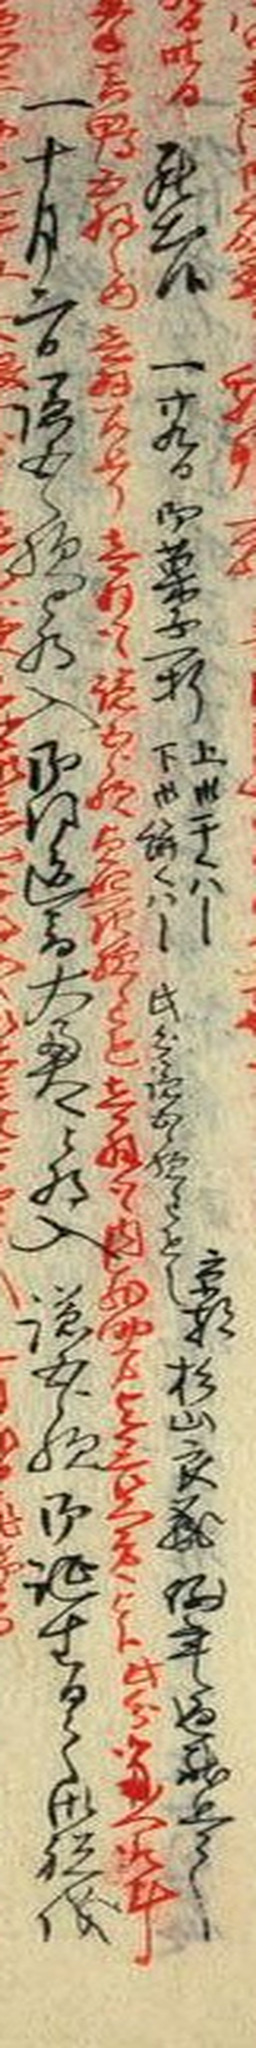一十月二日謙五郎様被為入御同道ニ而大奥へ被為入謙五郎様御誕生日之御祝儀
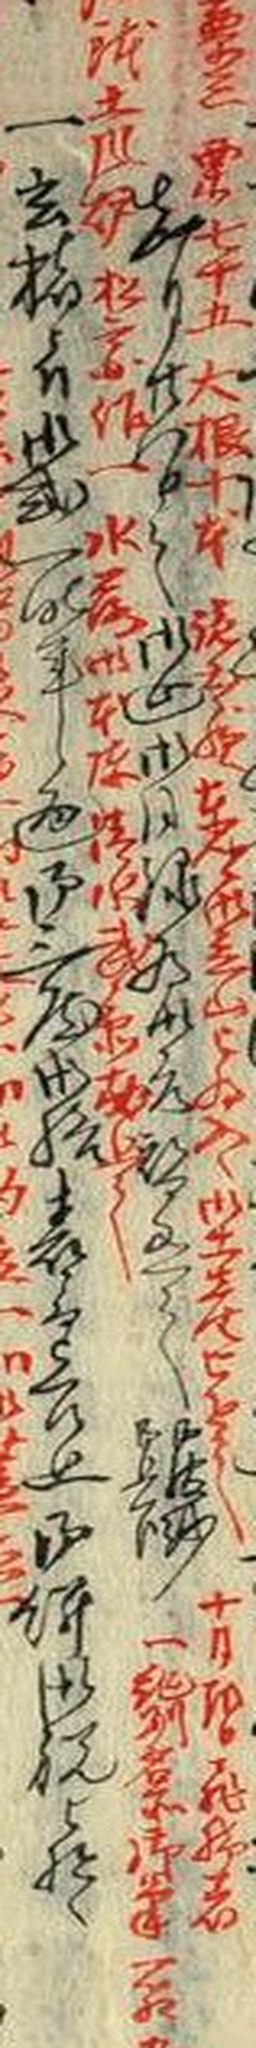一玄猪ニ付御式一昨年之通御三度御膳表ニ而被召上御餅御祝被遊候
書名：少傅日録抄（斉承付側向頭取日記、在国）
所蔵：福井県文書館 Fukui Prefectural Archives
